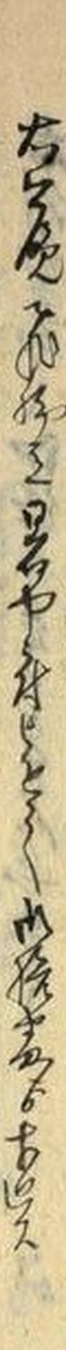右今晩飛脚立暑中ニ付被進之御膳番ゟ相廻ス
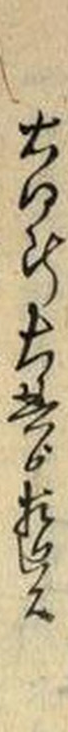右同断大奥ゟ相廻ス
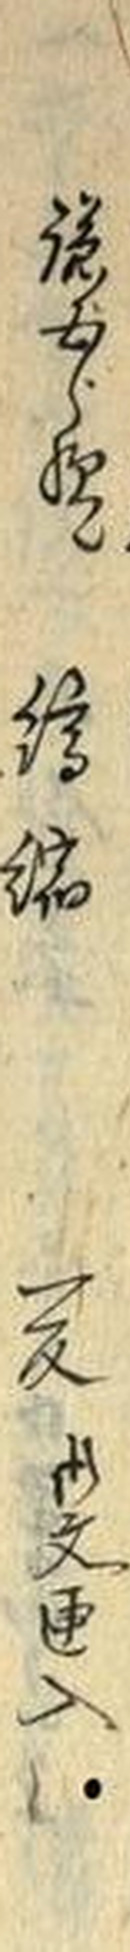謙五郎様へ縮緬一反御文匣入
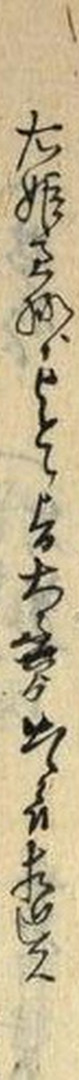右姫君様ゟ被進之旨大奥ゟ出候付相廻ス
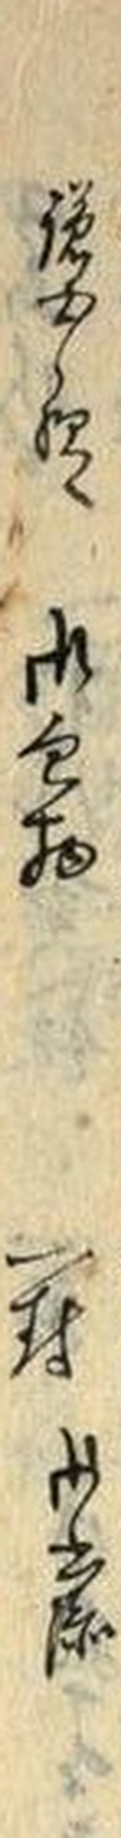謙五郎様へ御包物一封御書添
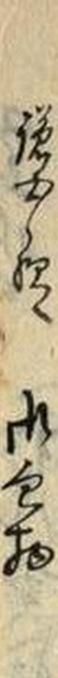謙五郎様へ紙包一箱
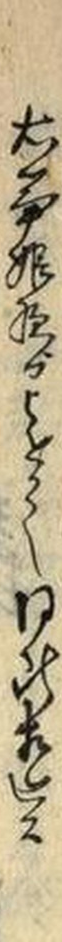右箏姫様ゟ被進之同断相廻ス
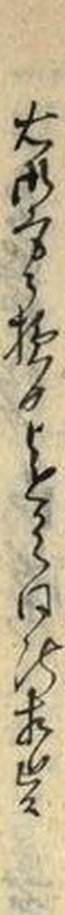右御方々様ゟ被進之同断相廻ス

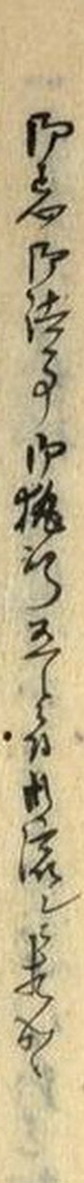御忌御法事御執行有候付御流シニ相成候
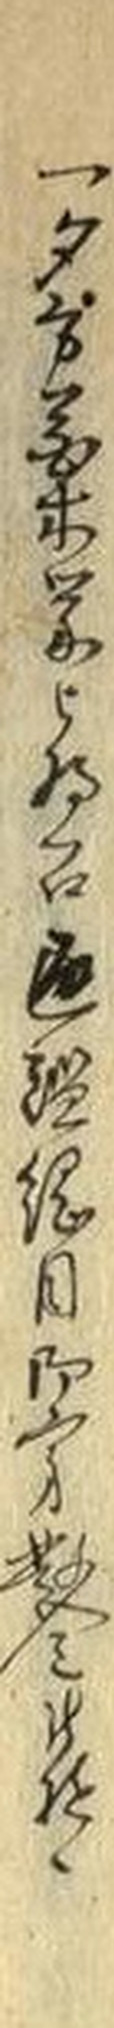一夕方花木栄被為召通鑑綱目御穿鑿被遊候
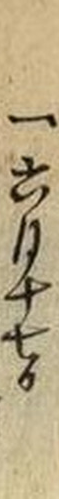一六月十七日
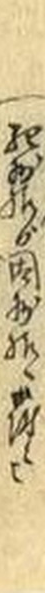紀州様ゟ因州様へ御附ニて
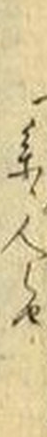参候人之由
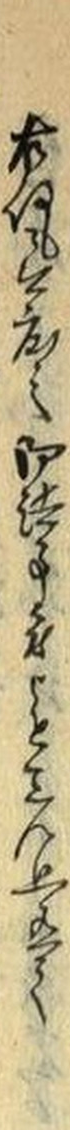右何も今度之御法事ニ付被進差上有之
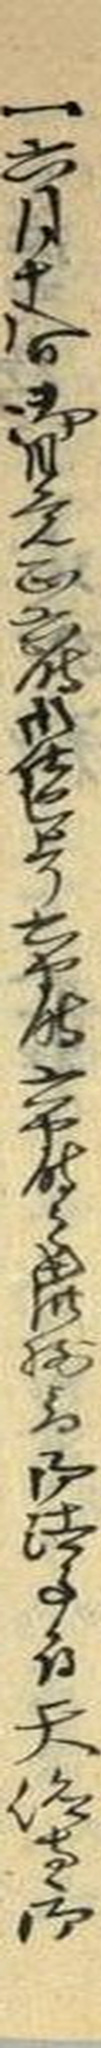一六月十八日御目覚正六時御仕廻上り六半時六半時過御供揃ニ而御法事ニ付天徳寺へ御
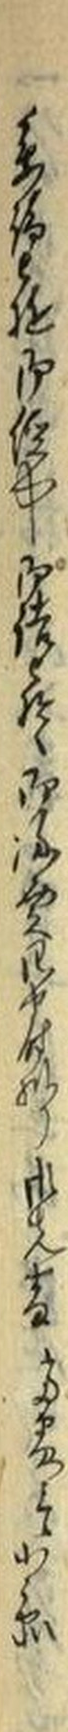参詣被遊御経中御詰被遊候御帰殿四半時掛り御先番当番ニて小兵衛
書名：少傅日録抄（斉承付側向頭取日記、在府）
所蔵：福井県文書館 Fukui Prefectural Archives
